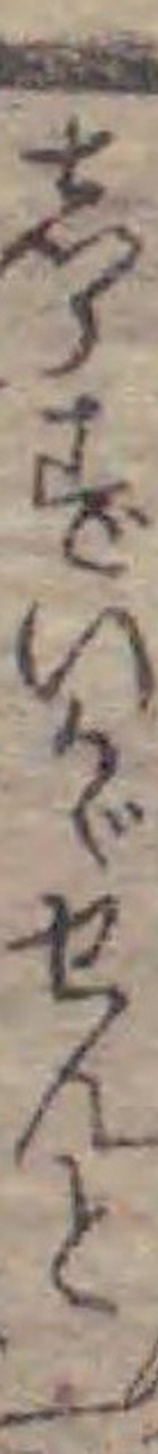しらずいかゞせんと
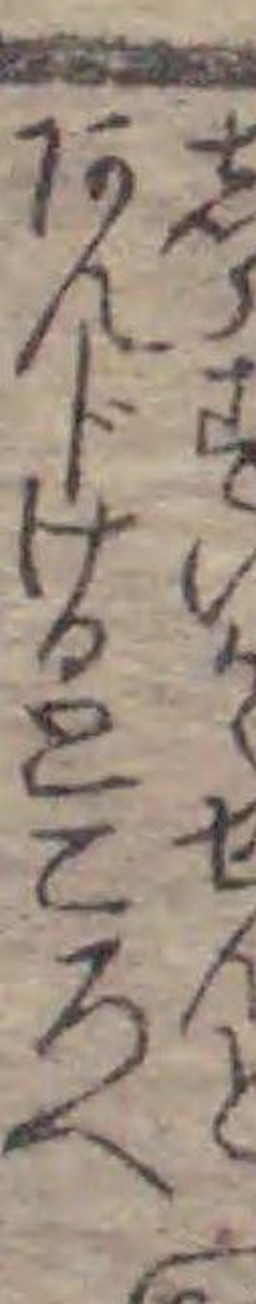あんじけるところへ
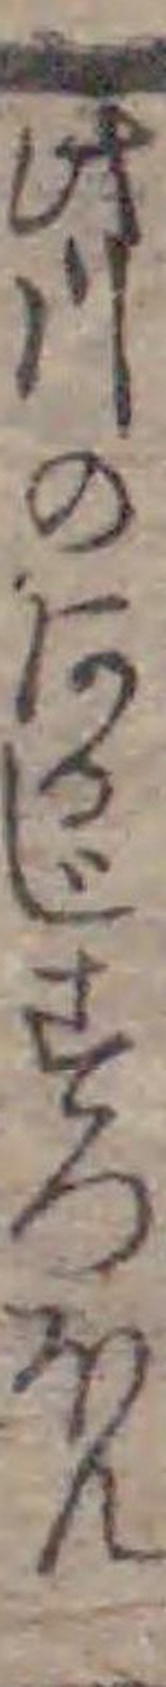此川のあるじすつほん
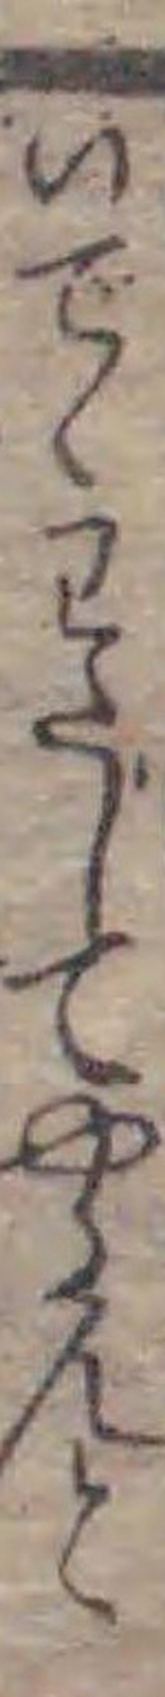いでゝわたしてやらんと
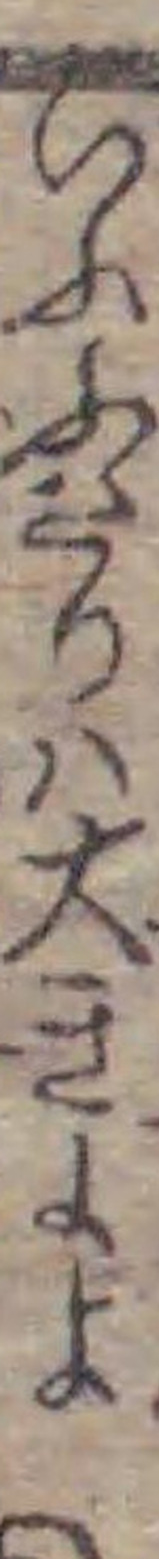いふふたりは大きによ
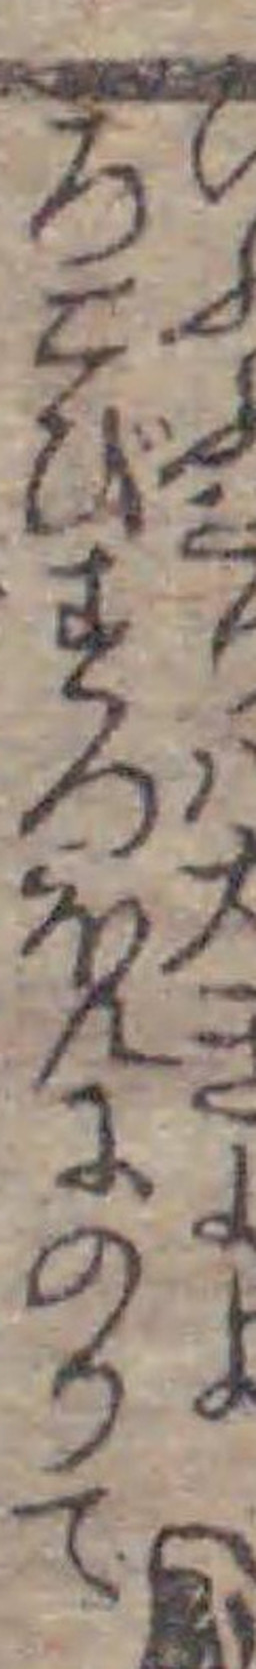ろこびすつほんにのりて
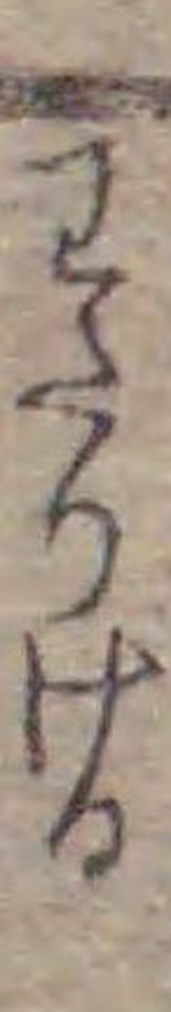わたりける
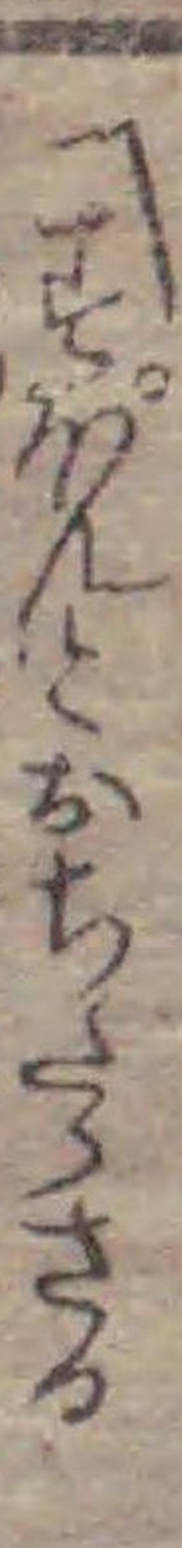〽すぽんとおちたらさる
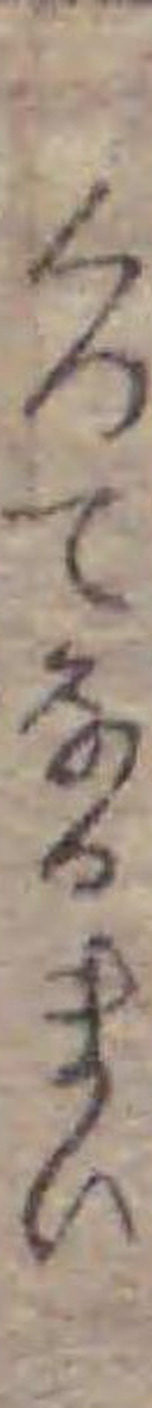くつてなるまひ
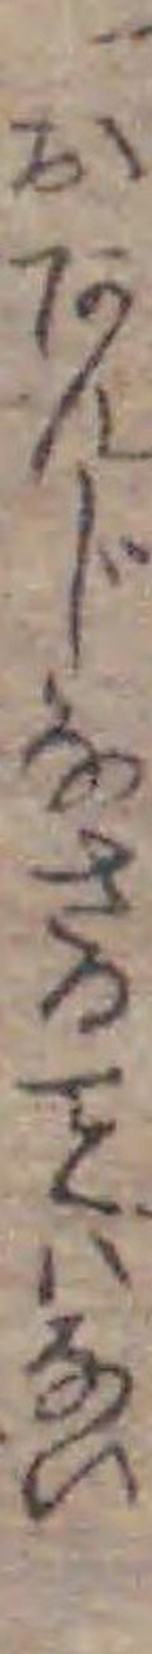〽おあんじなさることはない
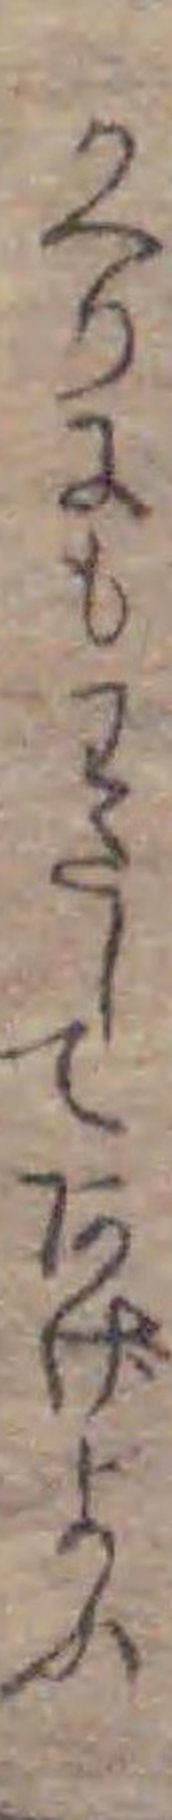かへりにもわたしてあげよふ

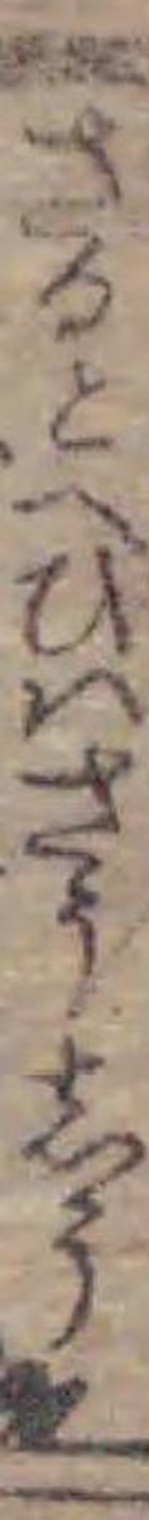さるとへびはさうしう
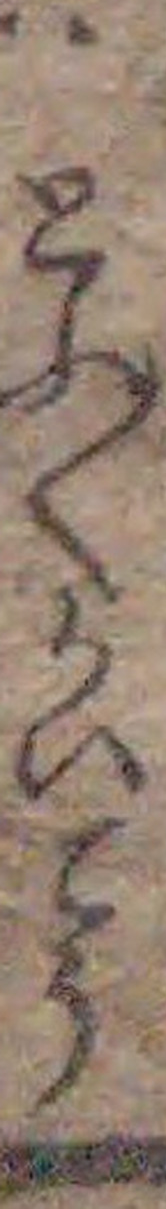とふ〳〵かいてう
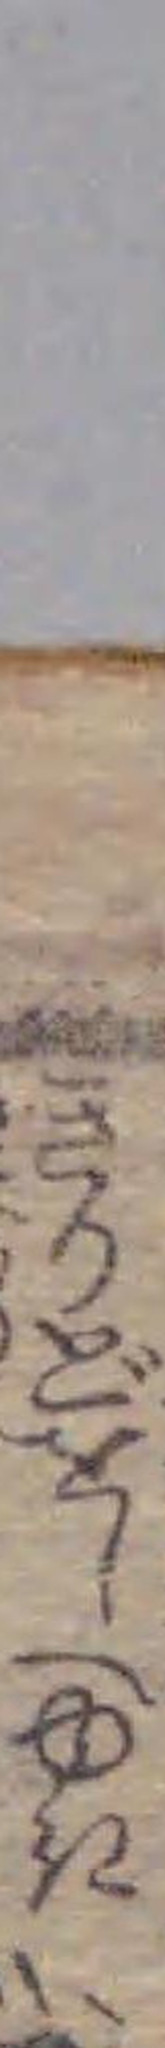きりどをしへゆき
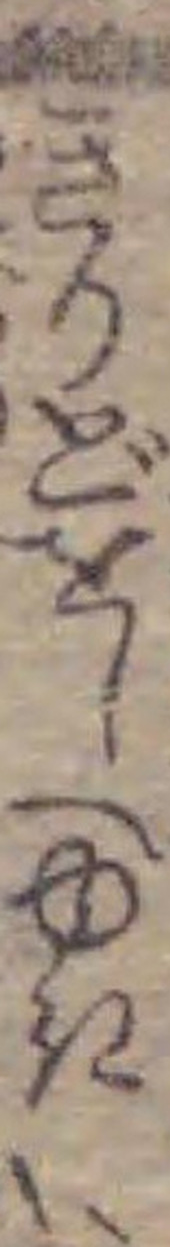きりどをしへゆき
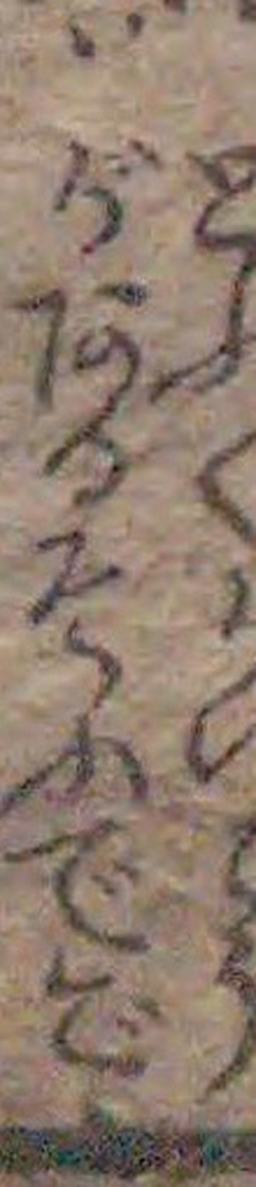があるそふでご
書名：化物七段目 : 2巻
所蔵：国立国会図書館 National Diet Library, JAPAN
